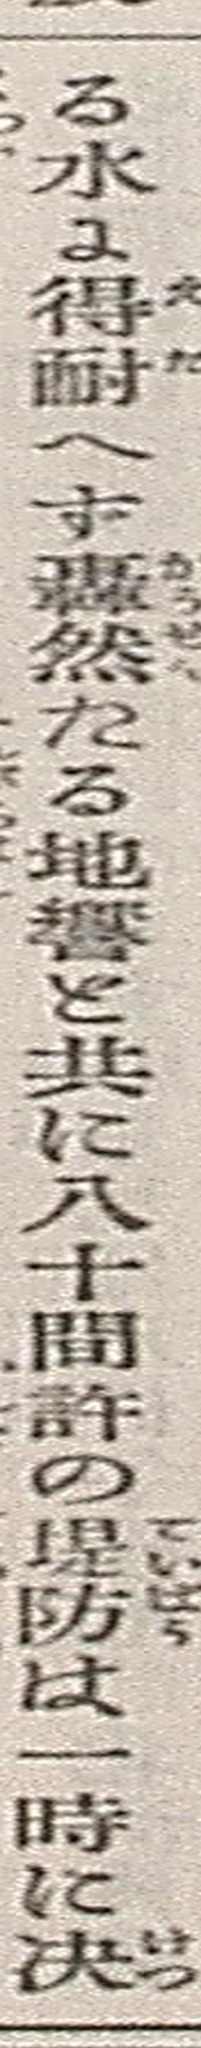る水に得耐へず轟然たる地響と共に八十間許の堤防は一時に决
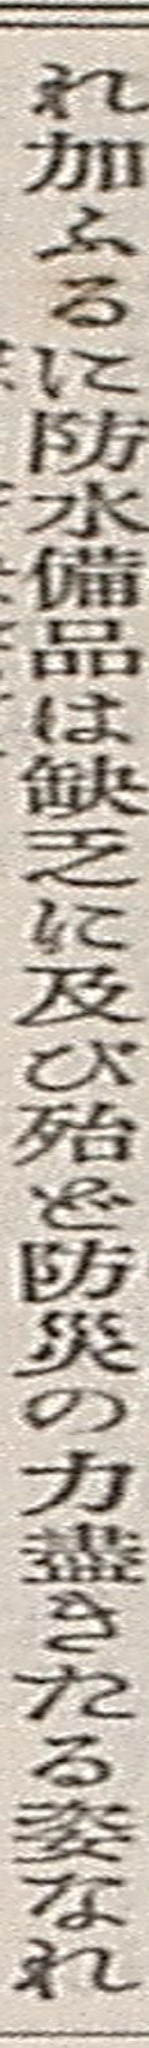れ加ふるに防水備品は缺乏に及び殆ど防災の力盡きたる姿なれ
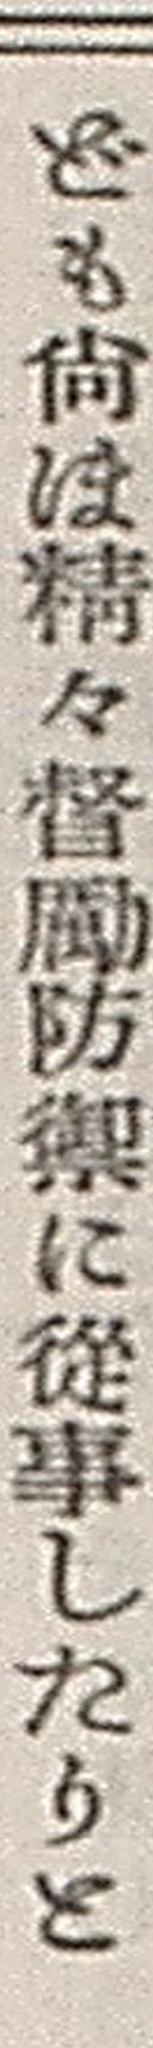ども尚ほ精々督励防禦に従事したりと
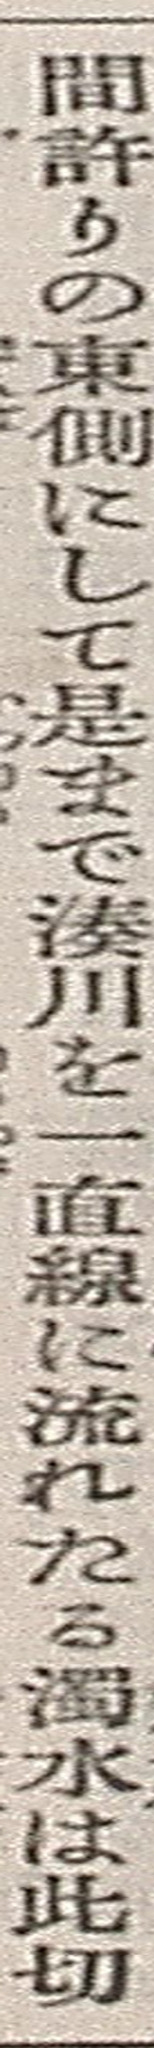間許りの東側にして是まで湊川を一直線に流れたる濁水は此切
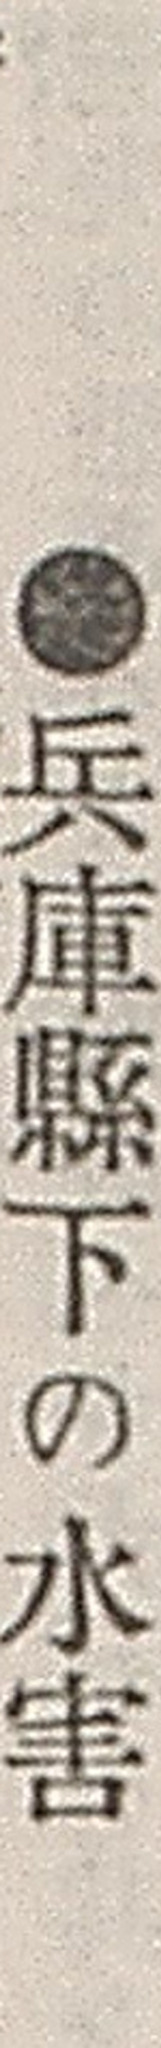●兵庫縣下の水害
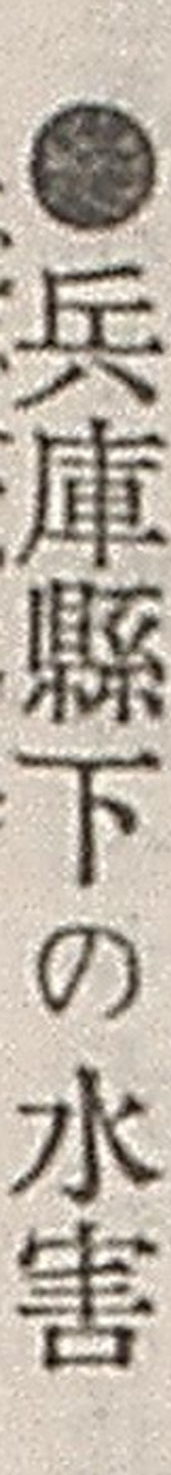●兵庫縣下の水害
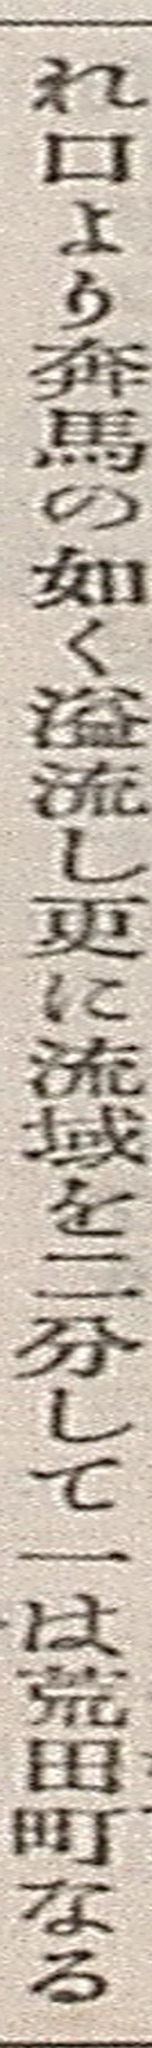れ口より奔馬の如く溢流し更に流域を二分して一は荒田町なる
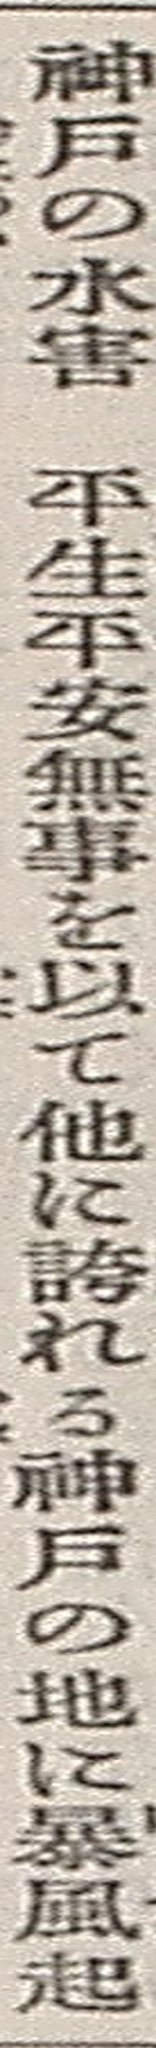神戸の水害平生平安無事を以て他に誇れる神戸の地に暴風起
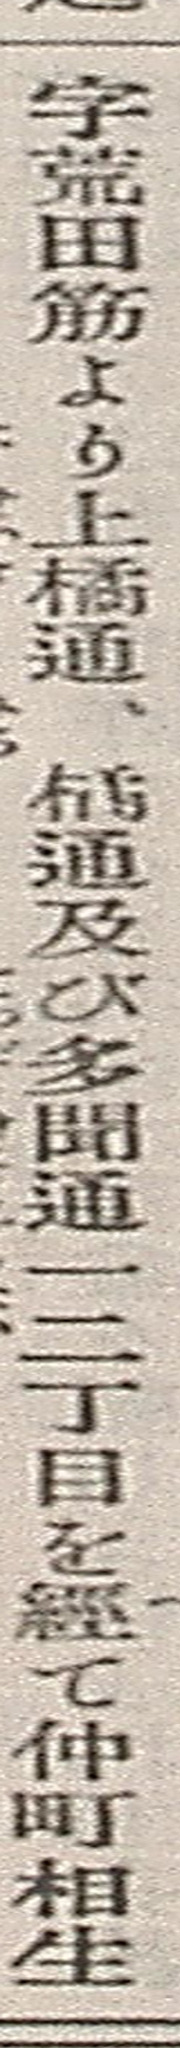字荒田筋より上橘通、橘通及び多聞通一二丁目を経て仲町相生
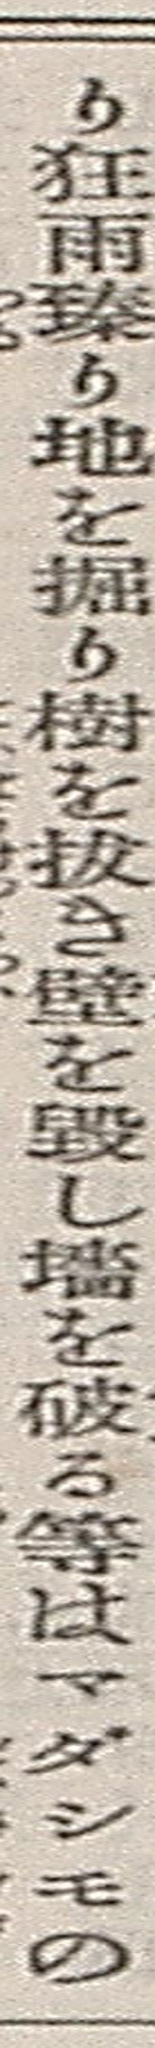り狂雨臻り地を掘り樹を抜き壁を毀し墻を破る等はマダシモの
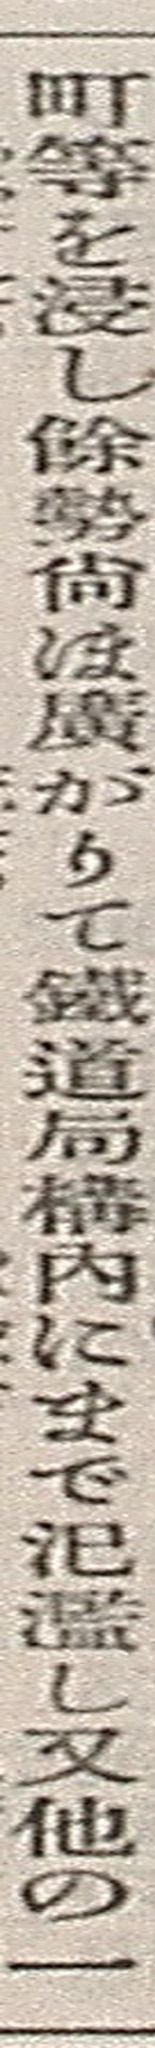町等を浸し餘勢尚ほ広がりて鉄道局構内にまで氾濫し又他の一
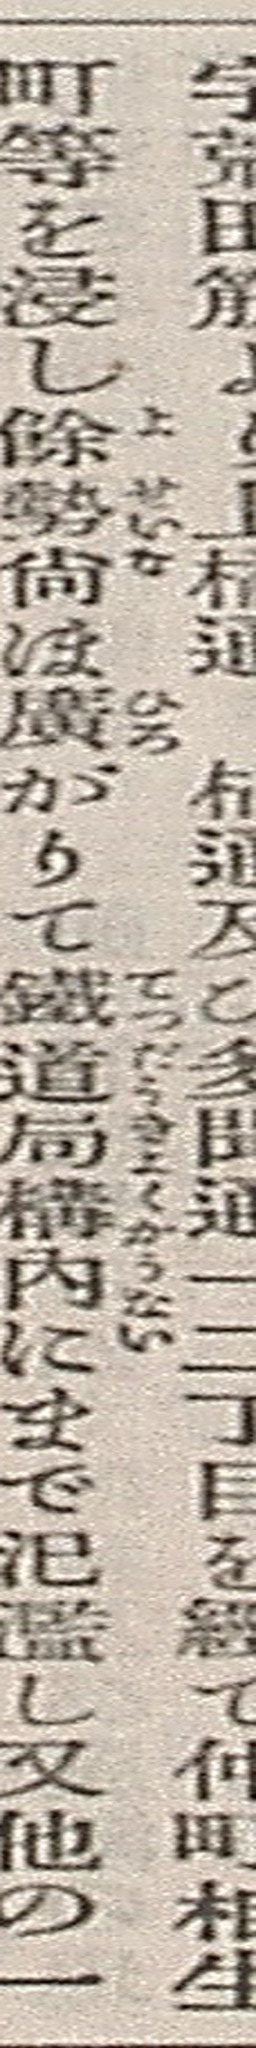町等を浸し餘勢尚ほ広がりて鉄道局構内にまで氾濫し又他の一
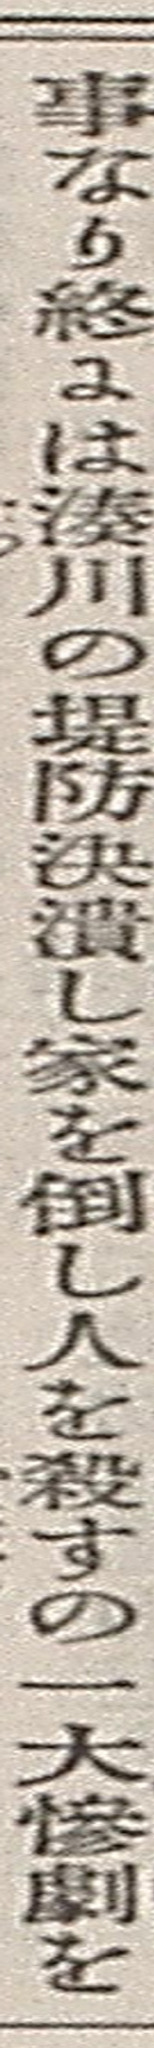事なり終には湊川の堤防決潰し家を倒し人を殺すの一大惨劇を
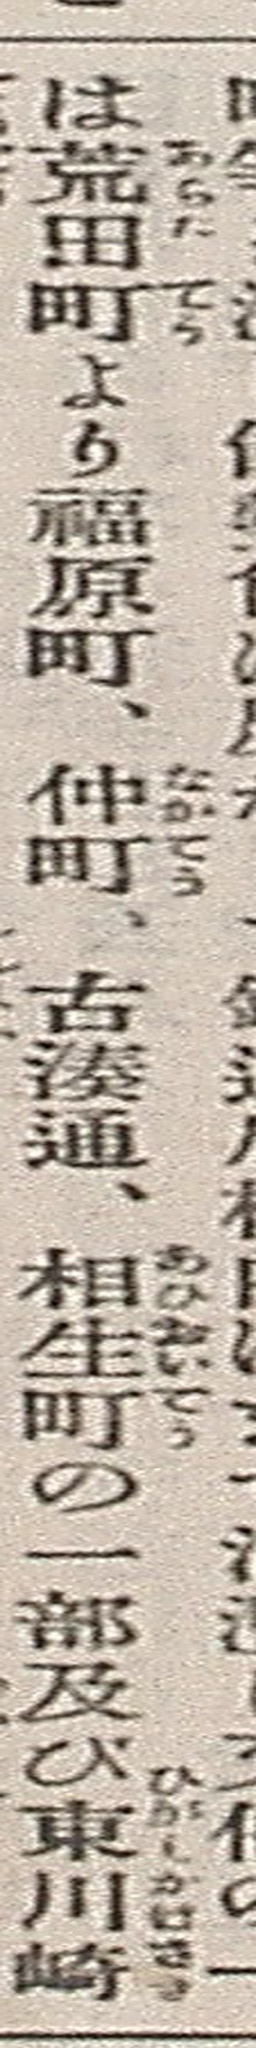は荒田町より福原町、仲町、古湊通、相生町の一部及び東川崎
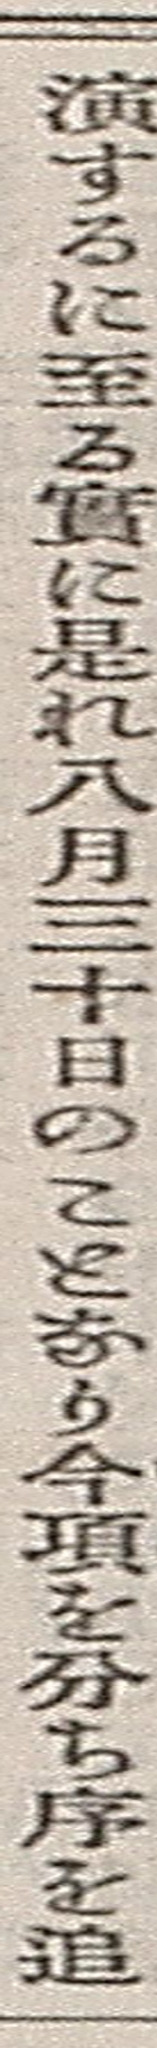演するに至る実に是れ八月三十日のことなり今項を分ち序を追
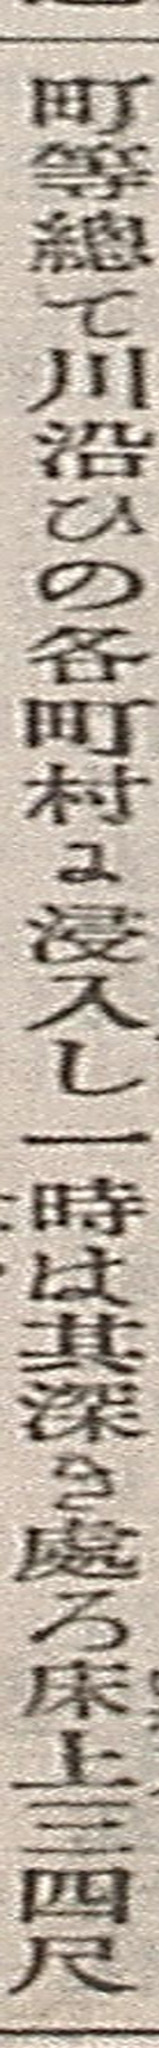町等総て川沿ひの各町村に侵入し一時は其深き処ろ床上三四尺
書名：風俗畫報臨時増刊第百二十八號　洪水被害録（下）
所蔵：東京大学地震研究所図書室 Earthquake Research Institute Library, The University of Tokyo, JAPAN
